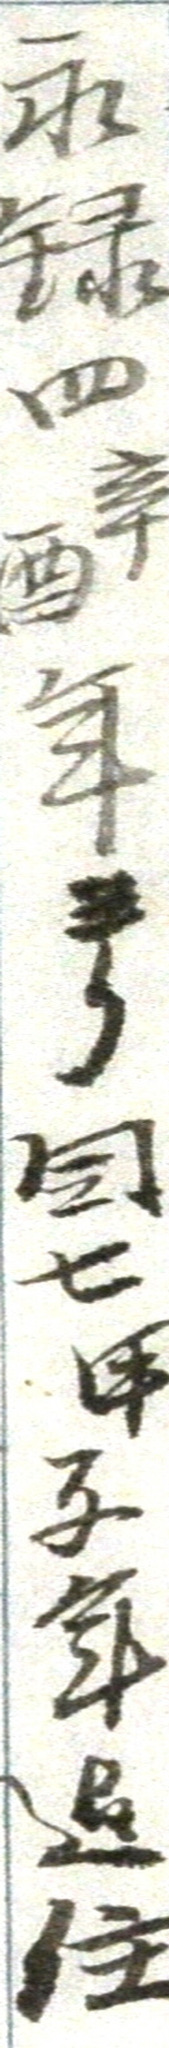永禄四辛酉年ヨリ同七甲子年退住
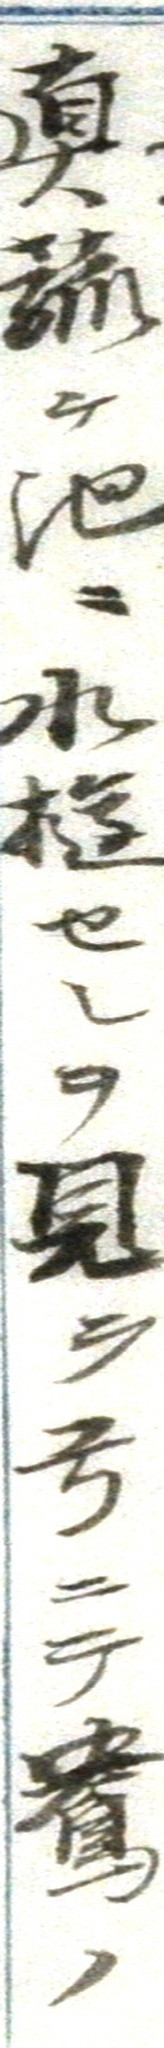真菰ヲ池ニ水遊セシヲ見テ弓ニテ鴦ノ
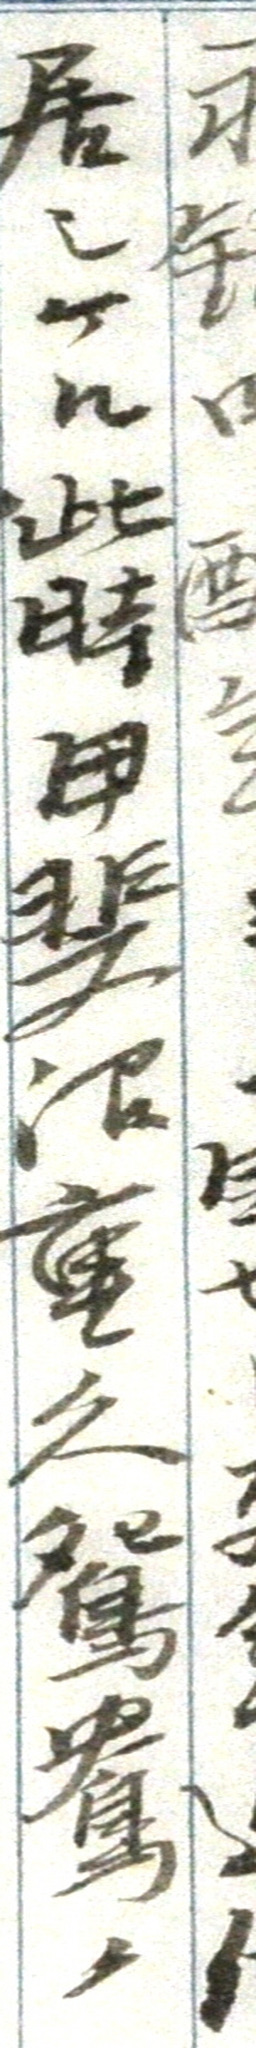居レケル此時甲斐沼重久鴛鴦ノ
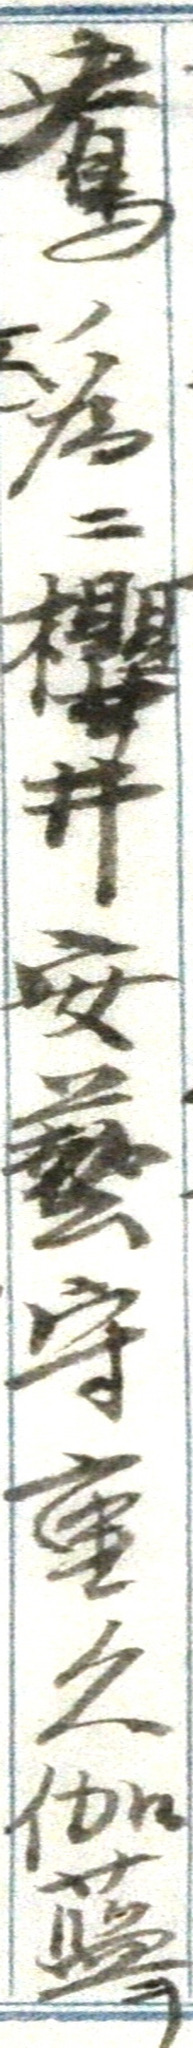鴦ノ為ニ桜井安芸守重久伽藍ヲ
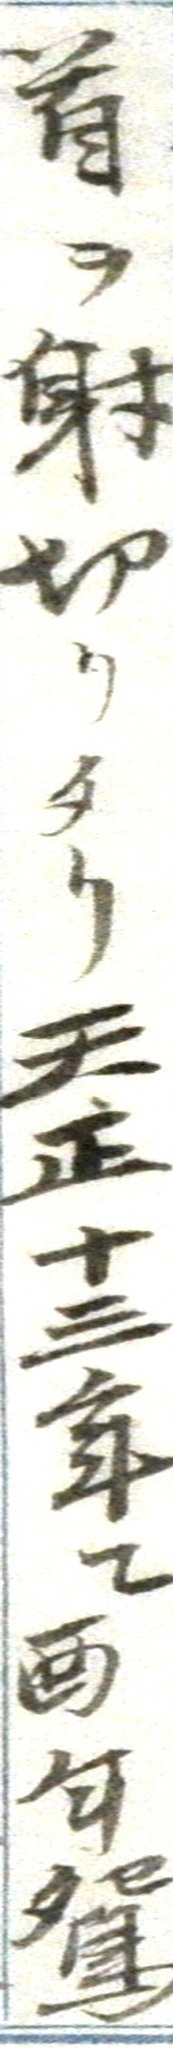首ヲ射切リタリ天正十三年乙酉年鴛
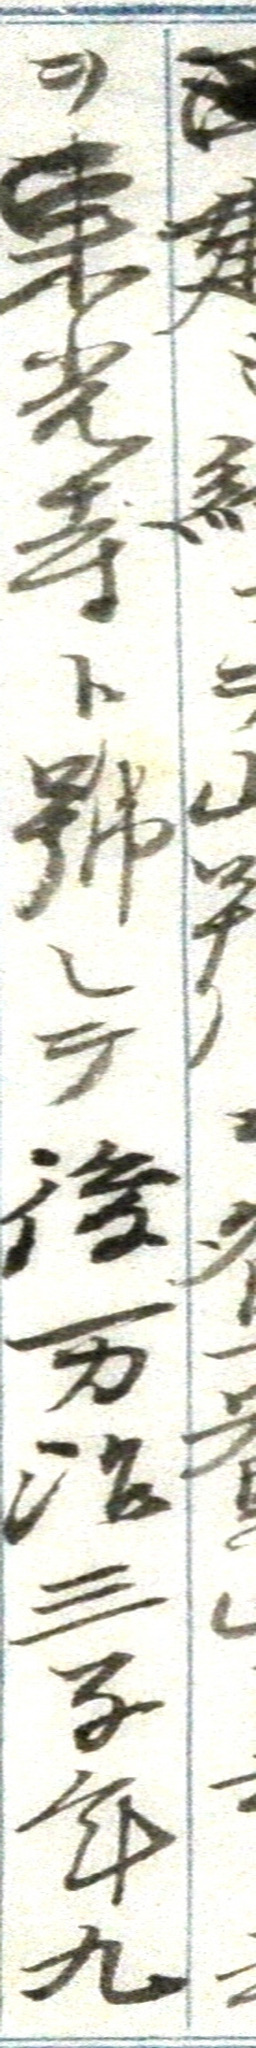ヲ東光寺ト号シテ後万治三子年九
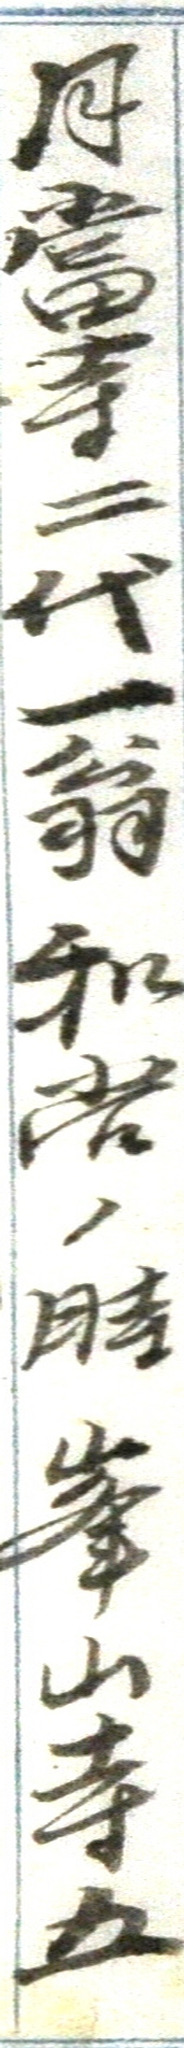月当寺二代一翁和尚ノ時峯山寺五
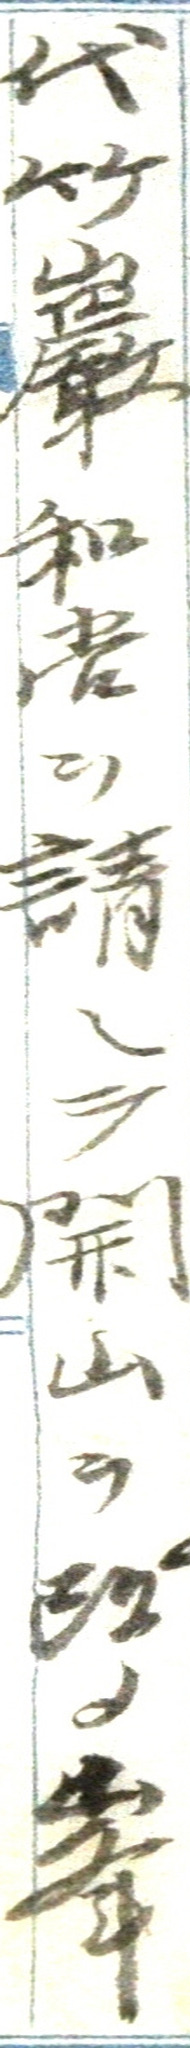代竹巌和尚ヲ請シテ開山ヲ改メ峯

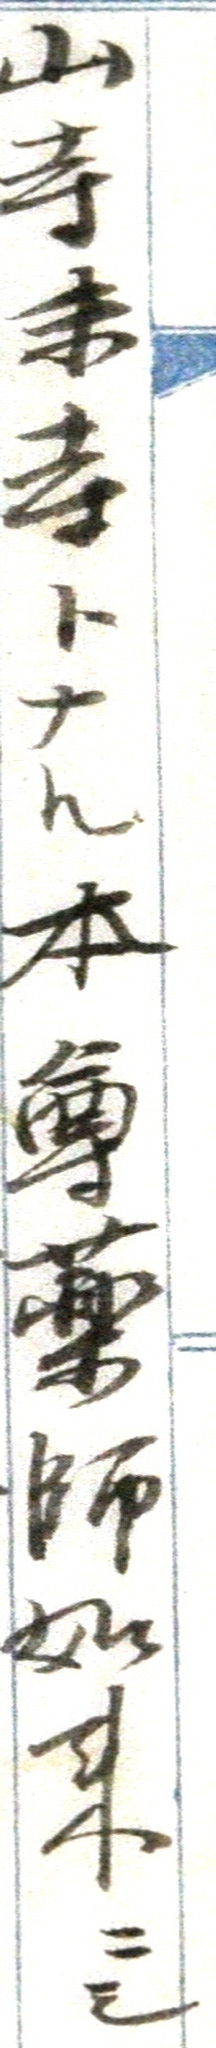山寺末寺トナル本尊薬師如来ニシ
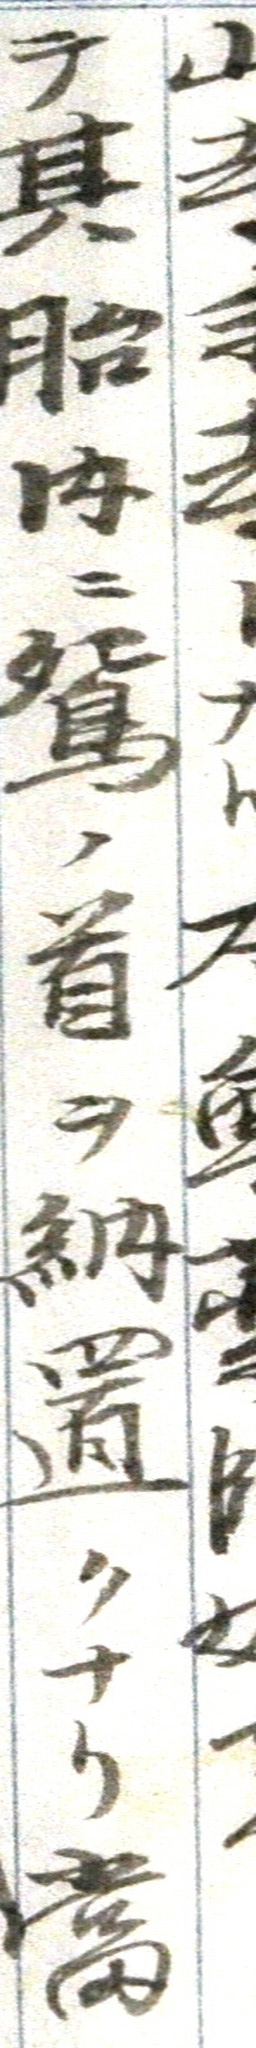テ其胎内ニ鴛ノ首ヲ納置クナリ当
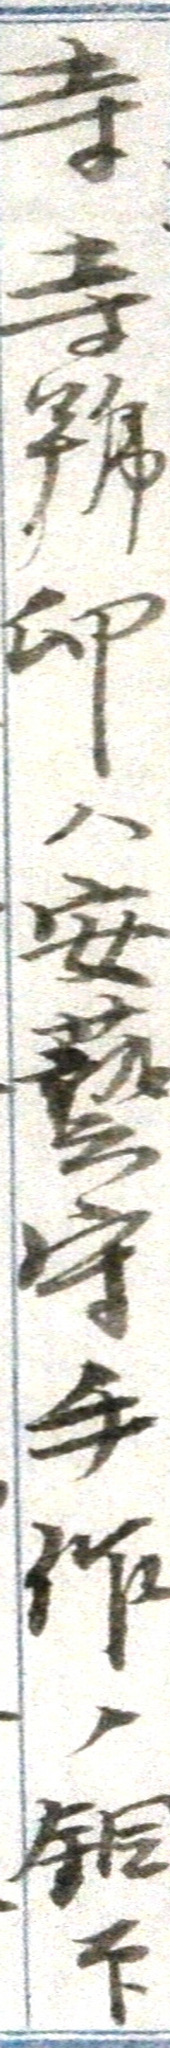寺寺号卬ハ安芸守手作ノ銅印
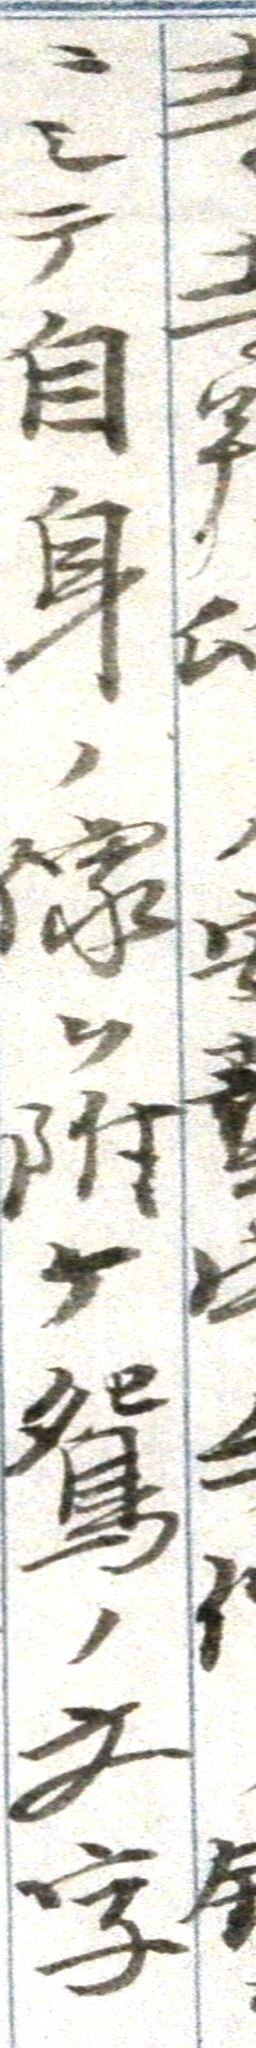ニシテ自身ノ像ヲ附ヶ鴛ノ文字
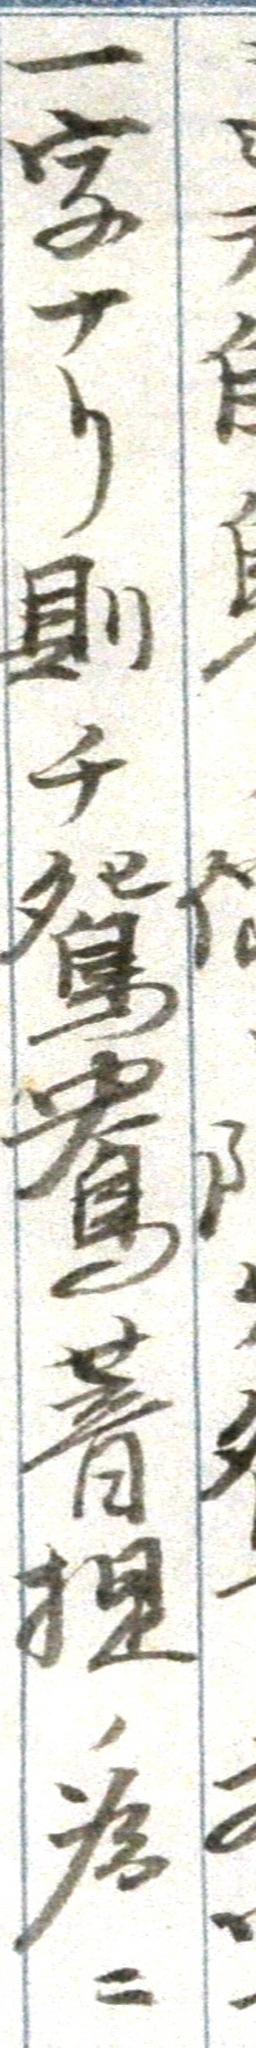一字ナリ則チ鴛鴦菩提ノ為ニ
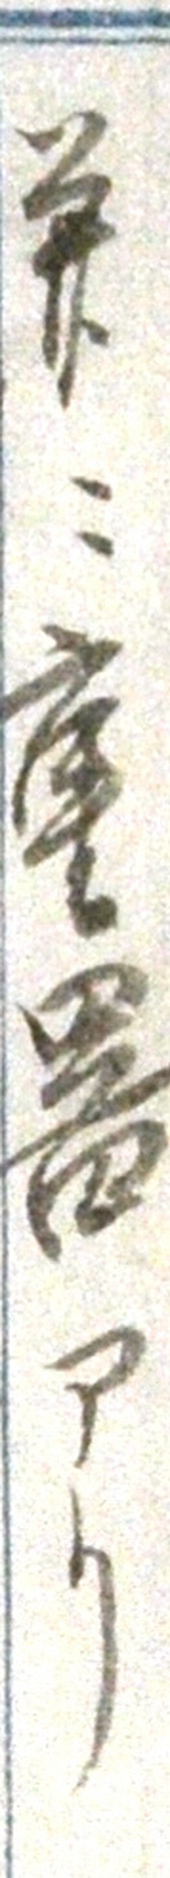并ニ重器アリ
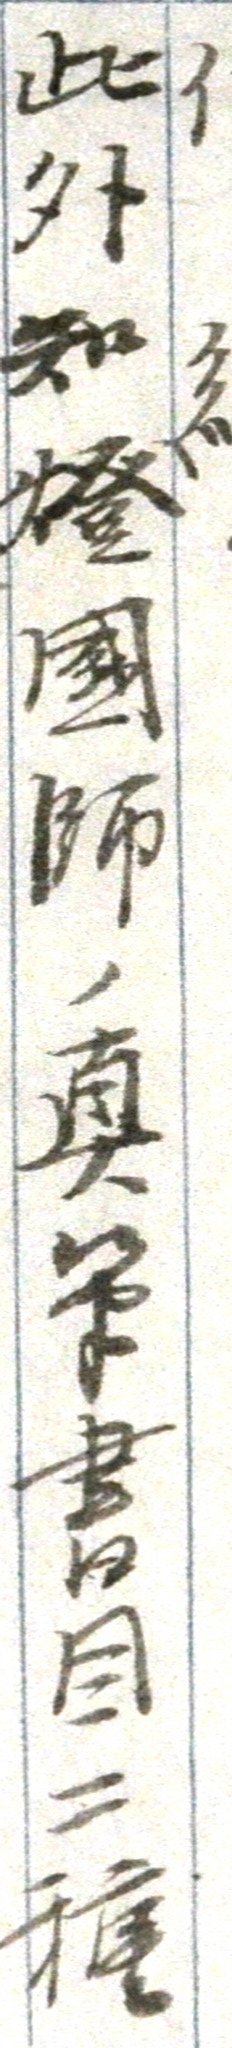此外知灯国師ノ真筆書目二種
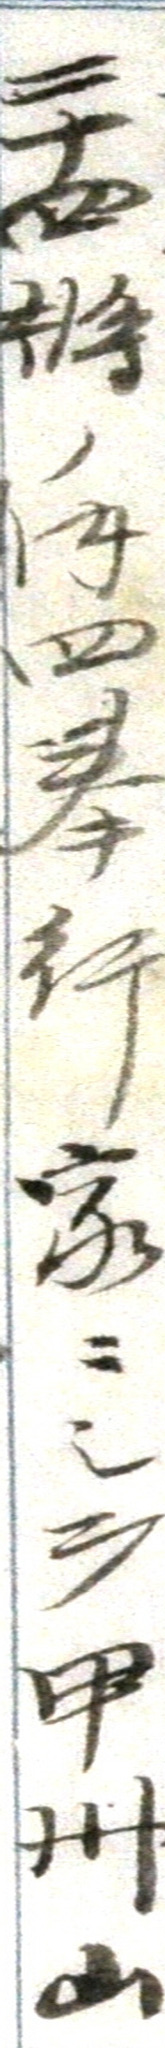二十四将ノ内四奉行家ニシテ甲州山
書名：桂泉院・樹林寺・東光寺縁起書、蓮華寺由来書、付夕顔観音記
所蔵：伊那市立高遠町図書館・合同会社AMANE
